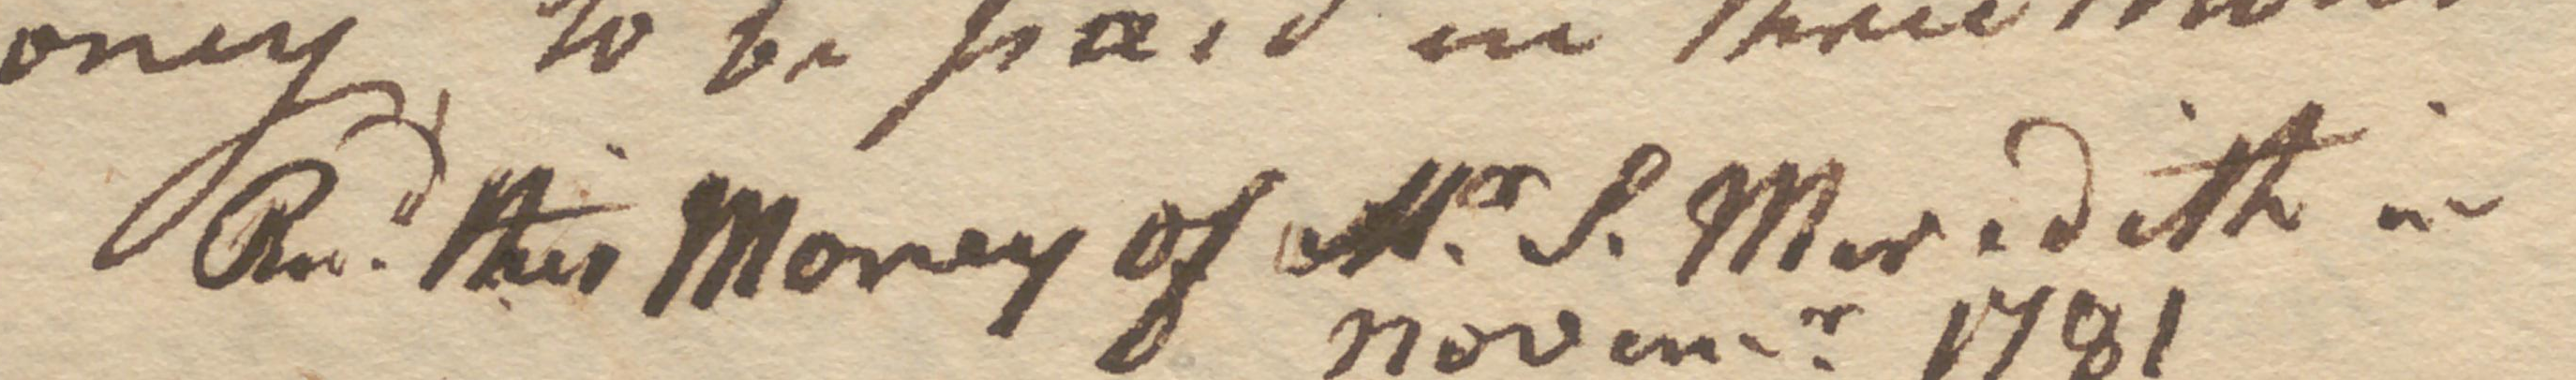Rec^d. this Money of M^r. S. Meredith in
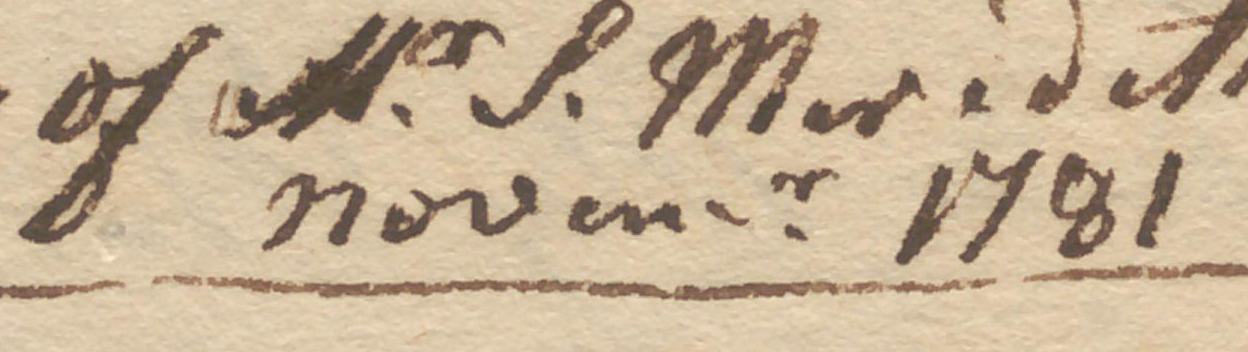Novem^r. 1781
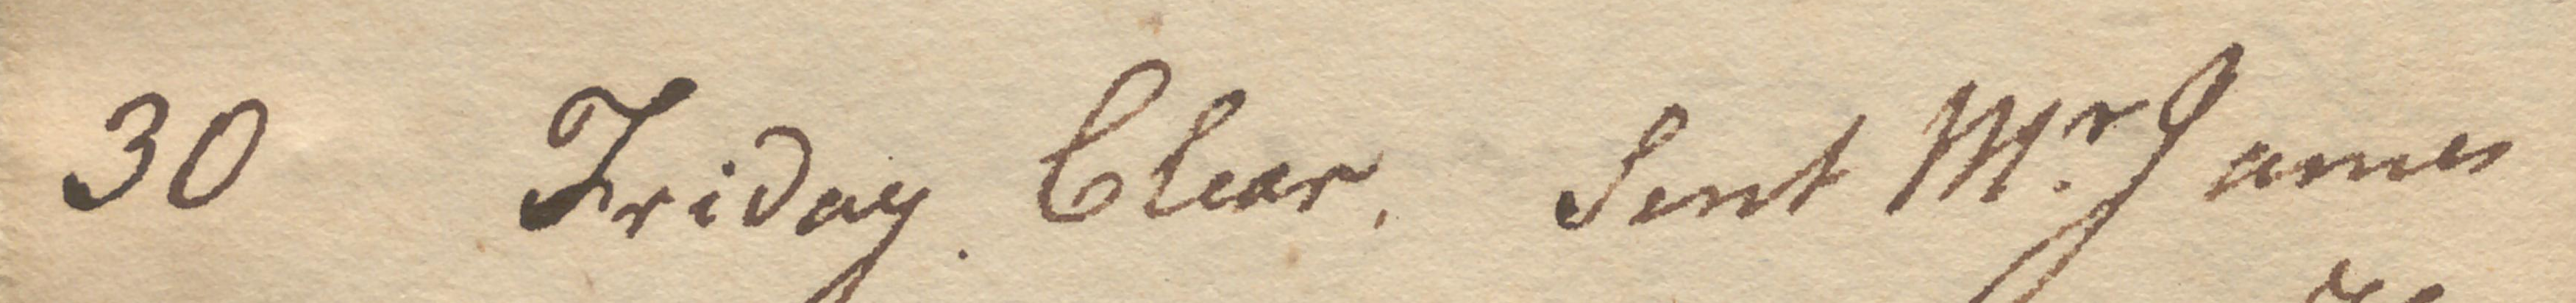30 Friday Clear. Sent M^r. James
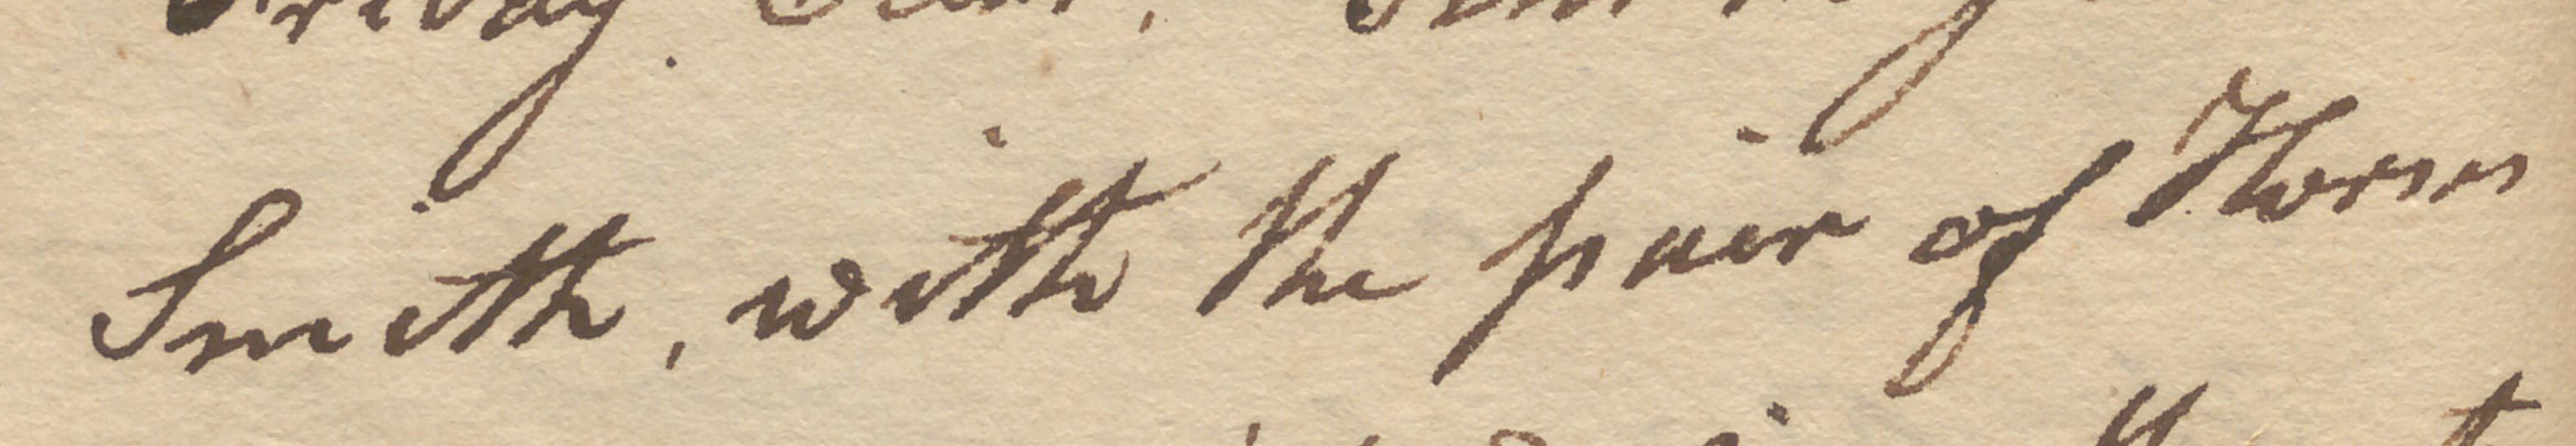Smith, with the pair of Horses
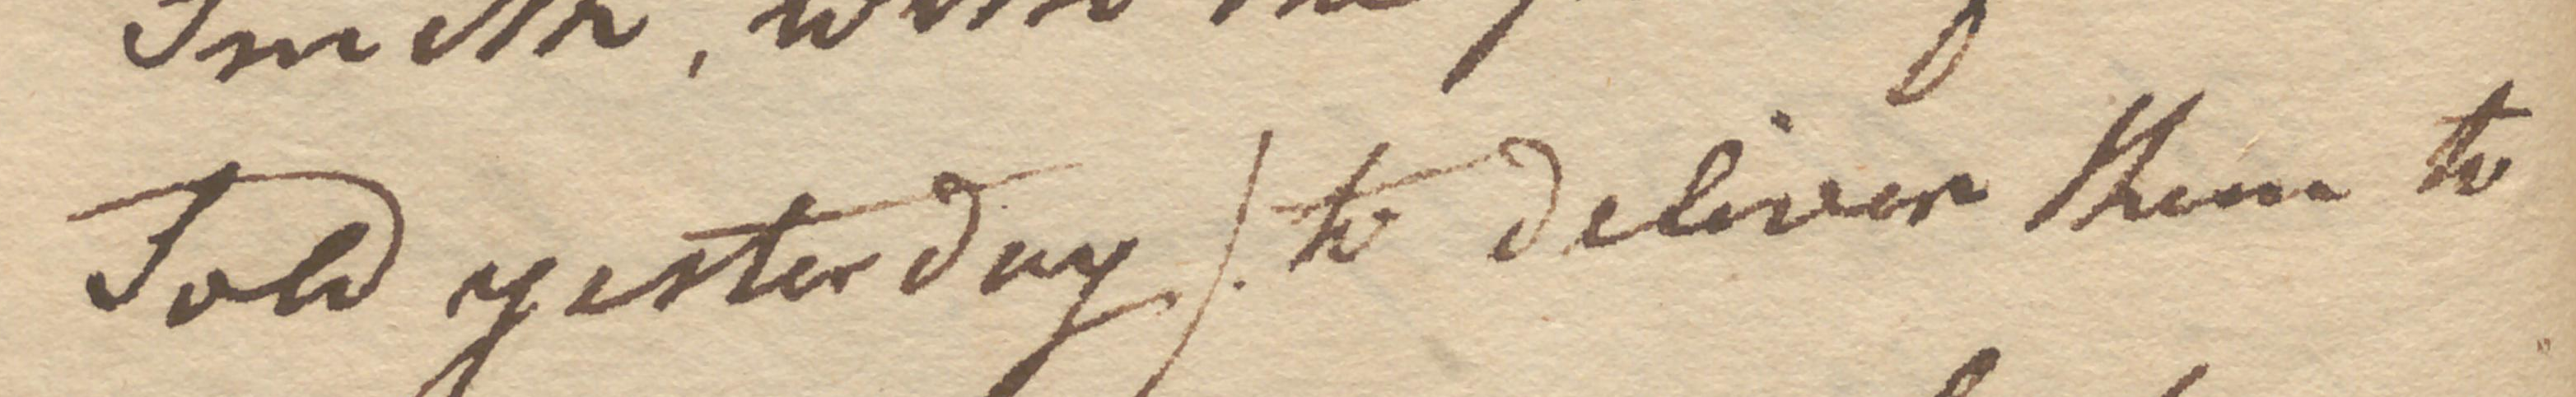Sold yesterday) to deliver them to
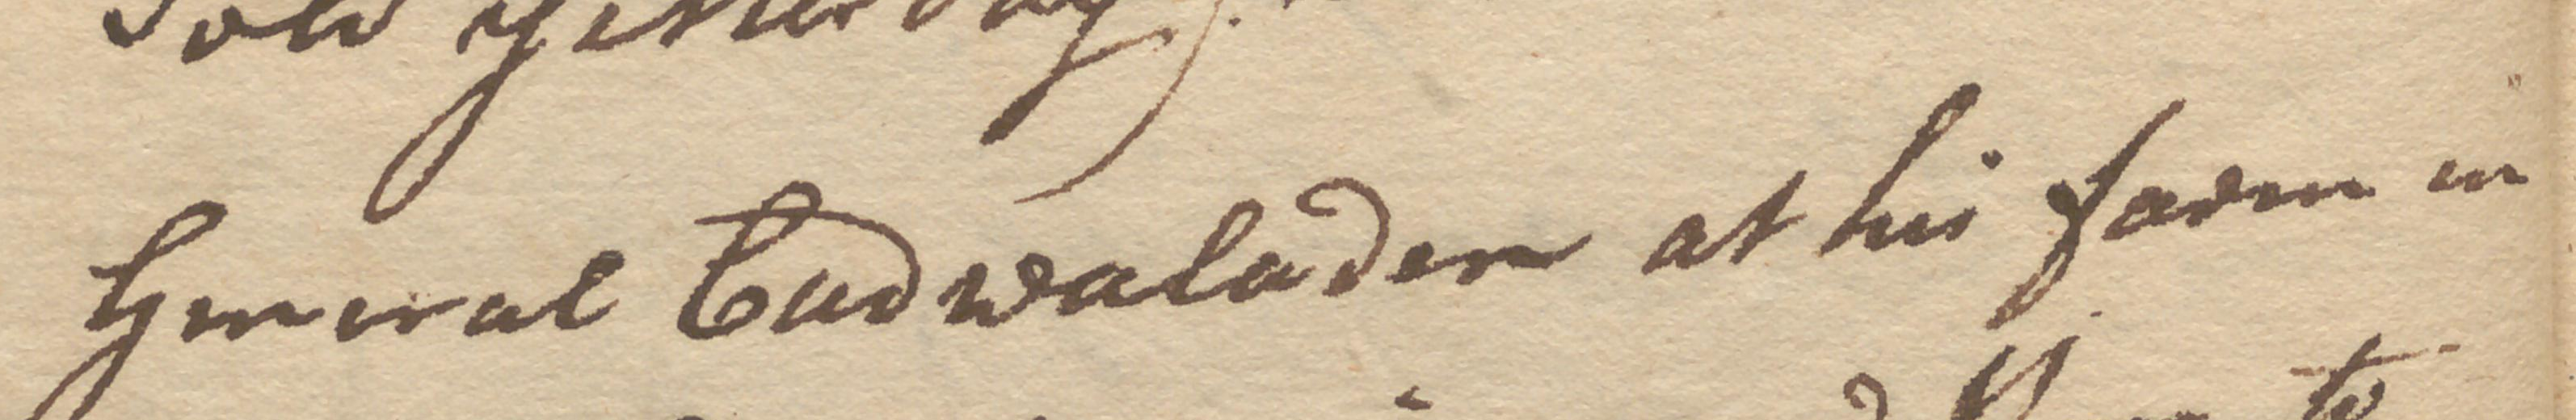General Cadwalader at his farm in
